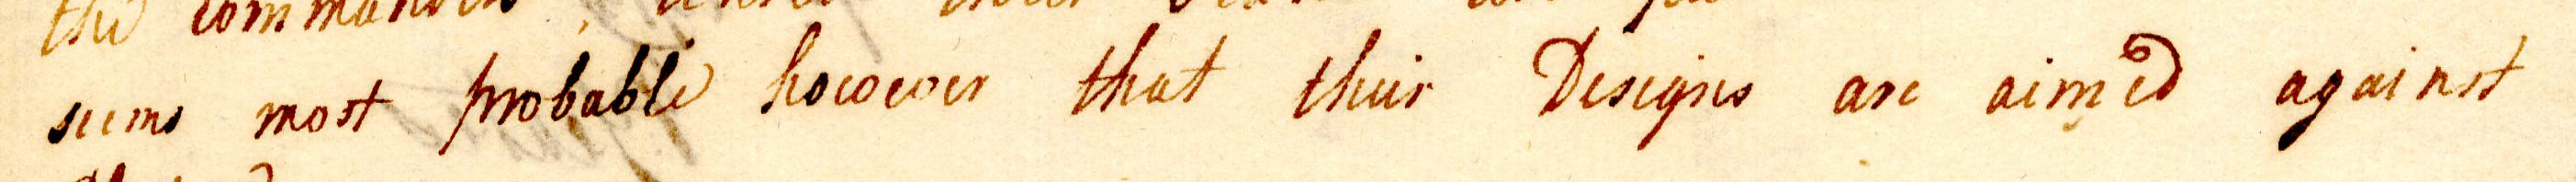seems most probable however that their Designs are aimed against
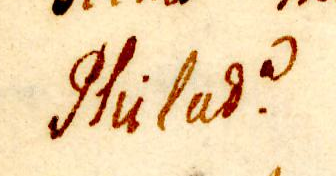Philad^a.
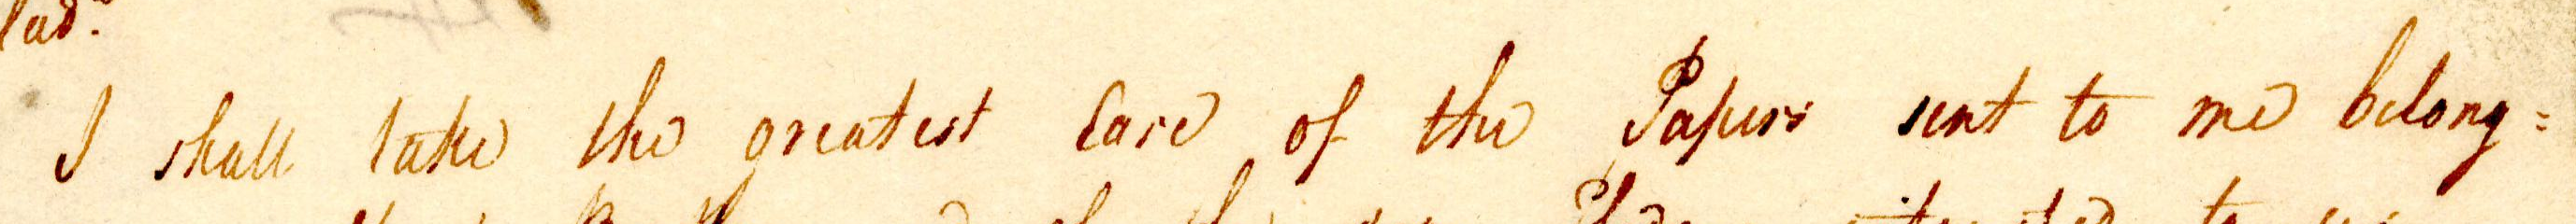I shall take the greatest Care of the Papers sent to me belong=
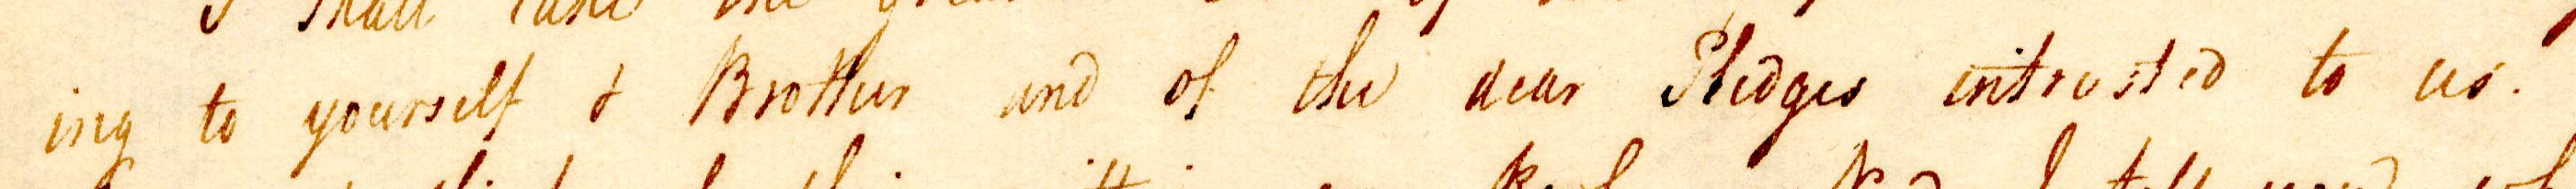ing to yourself & Brother and of the dear Pledges intrusted to us.
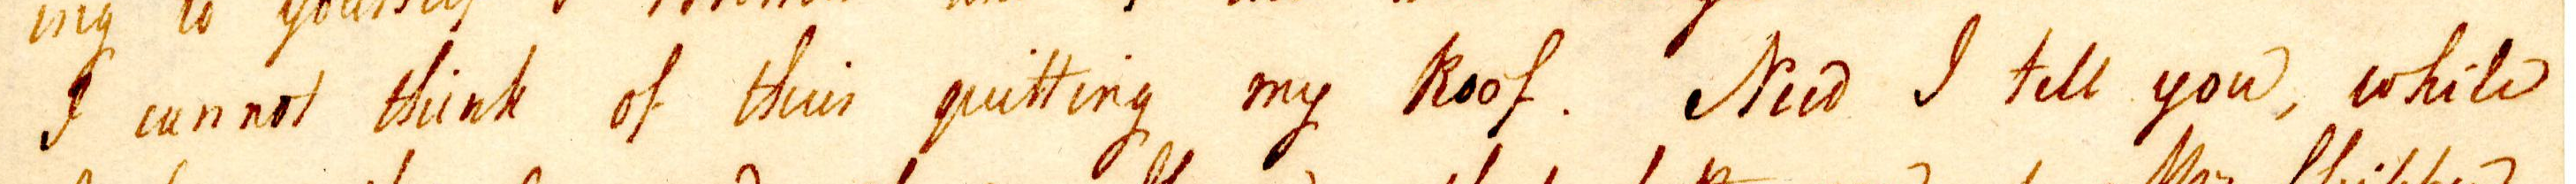I cannot think of their quitting my Roof. Need I tell you, while
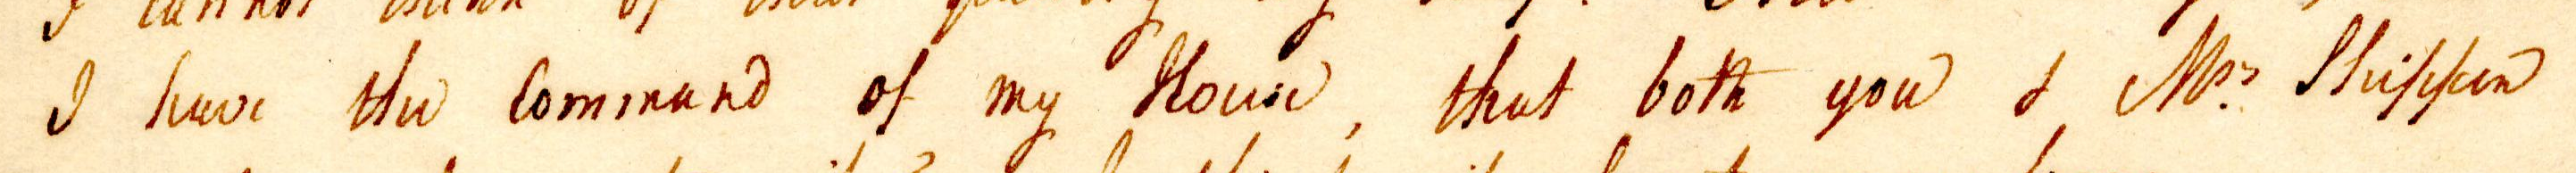I have the Command of my House, that both of you & M^rs. Shippen
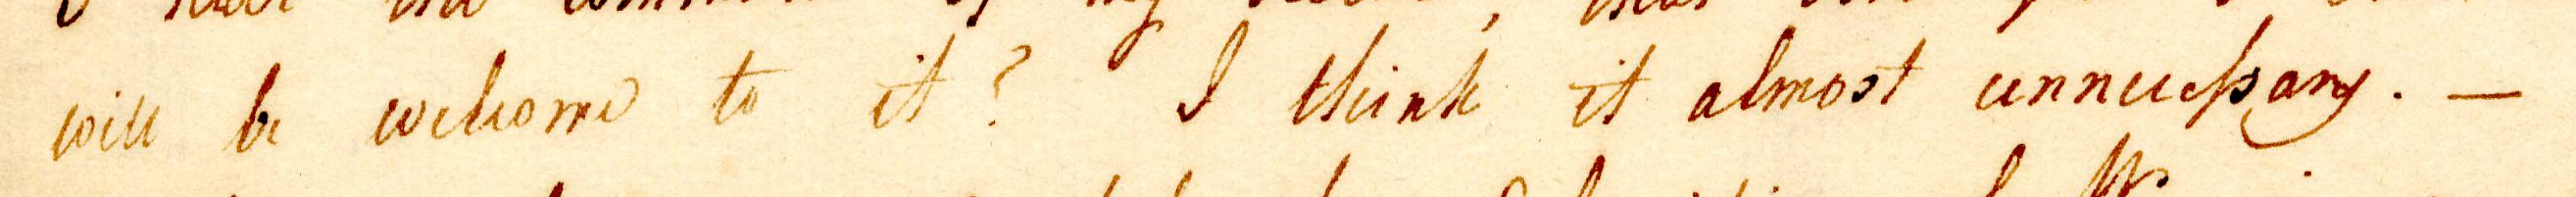will be welcome to it? I think it almost unnecessary.-
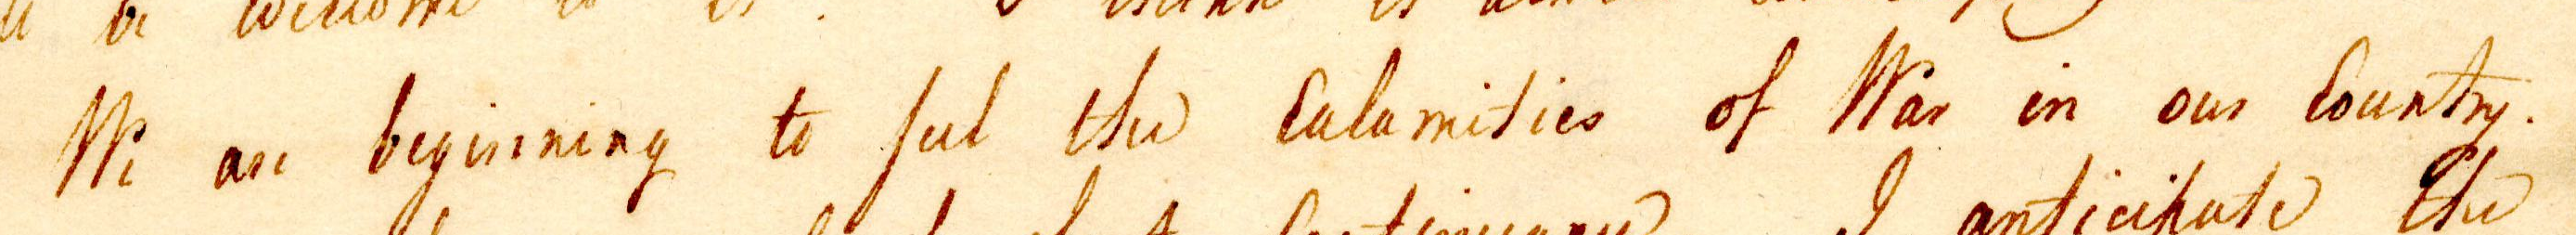We are beginning to feel the Calamities of War in our Country.
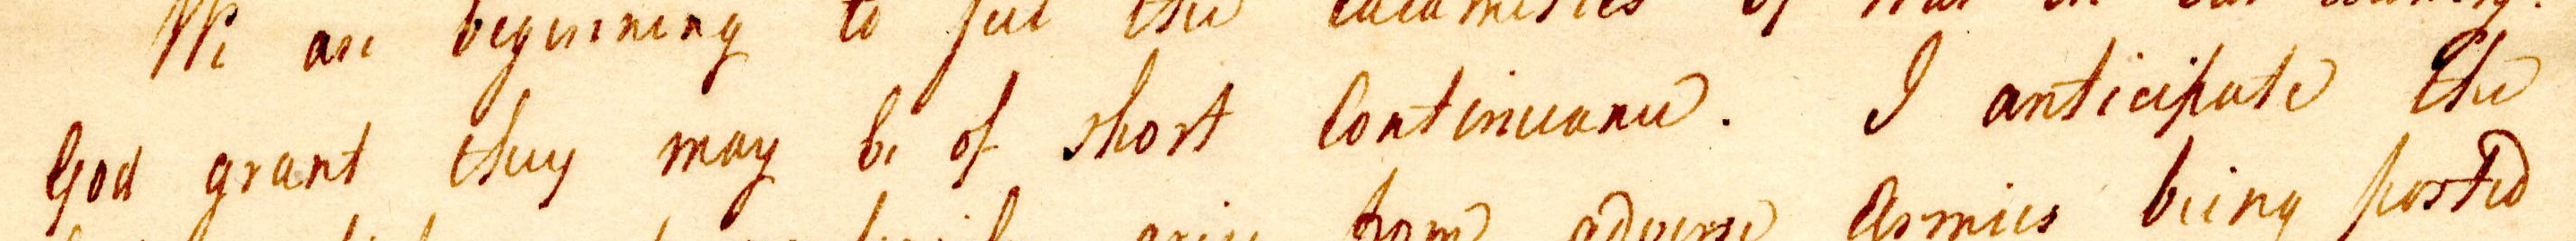God grant they may be of short Continuance. I anticipate the
